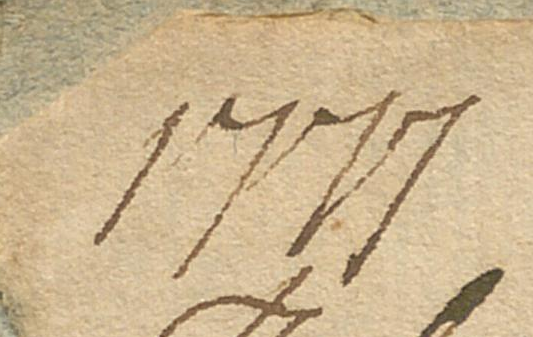1777
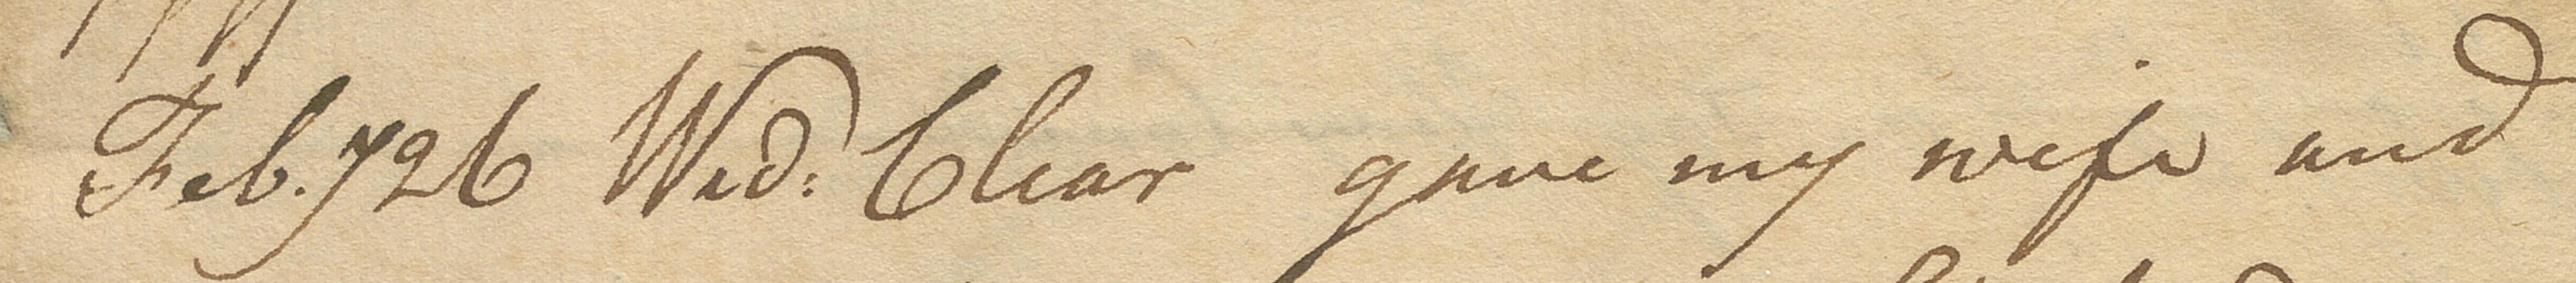Feb^y. 26 Wed: Clear gave my wife and
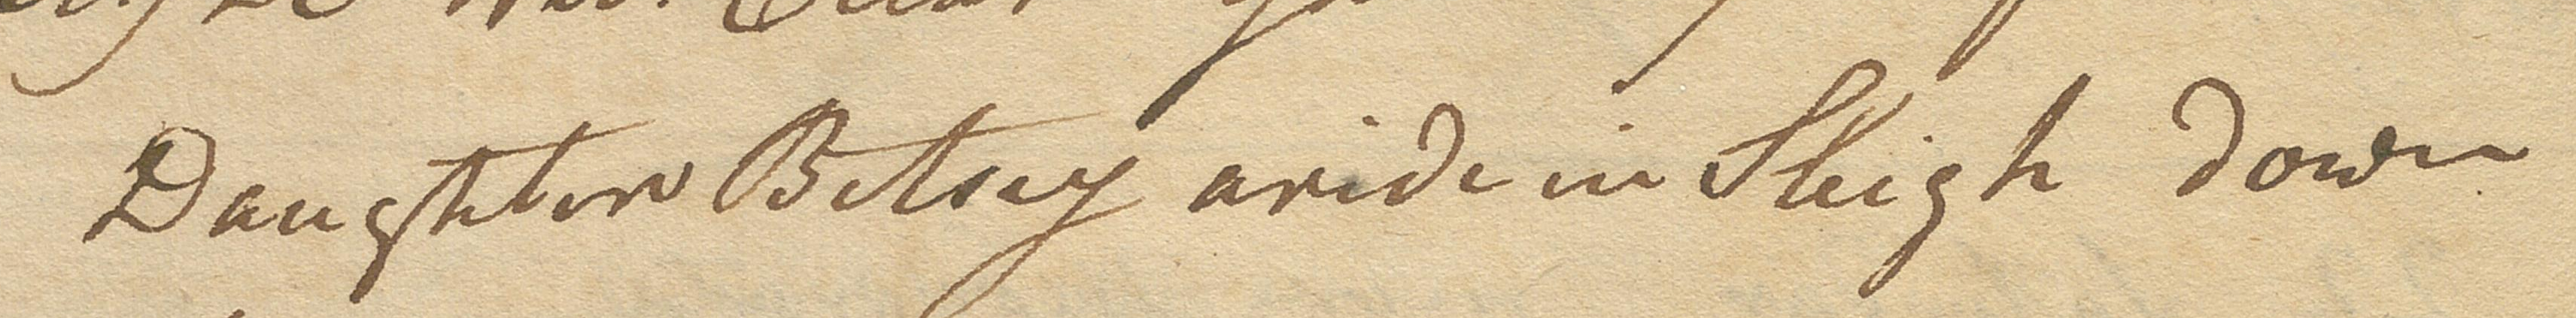Daughter Betsey a ride in Sleigh down
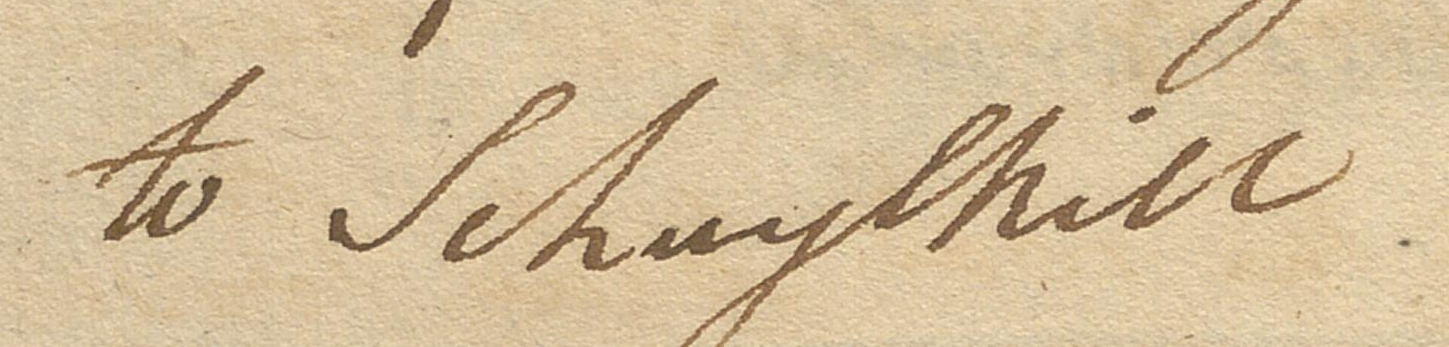to Schuylkill
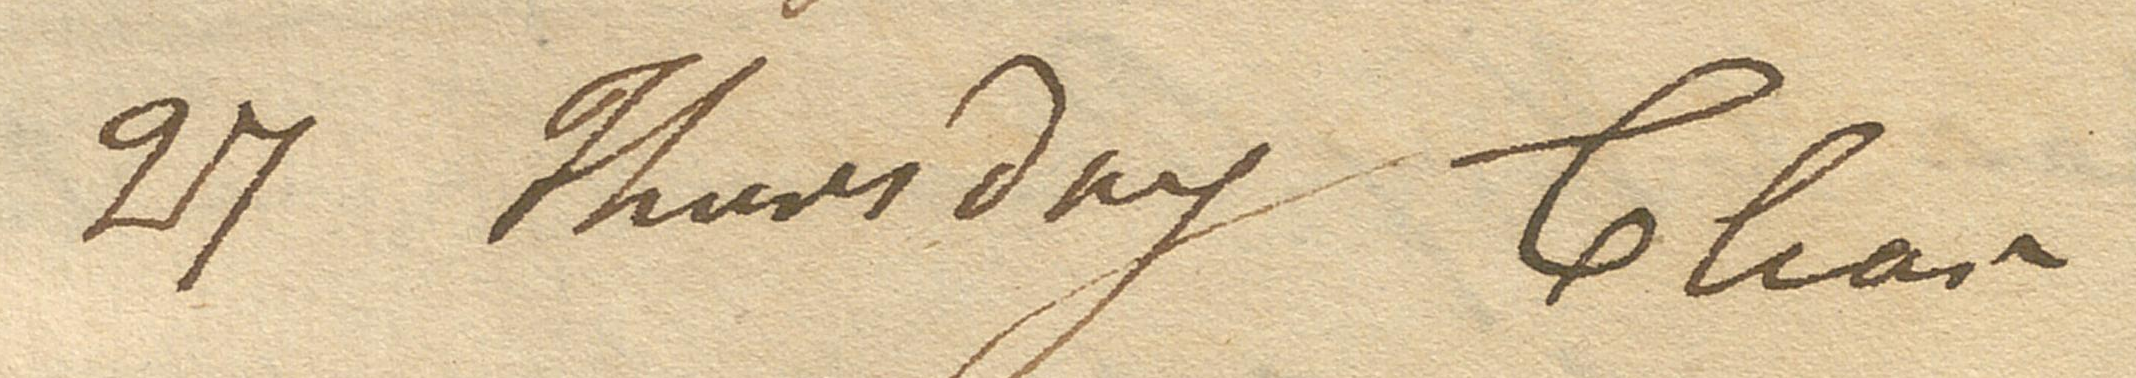27 Thursday Clear
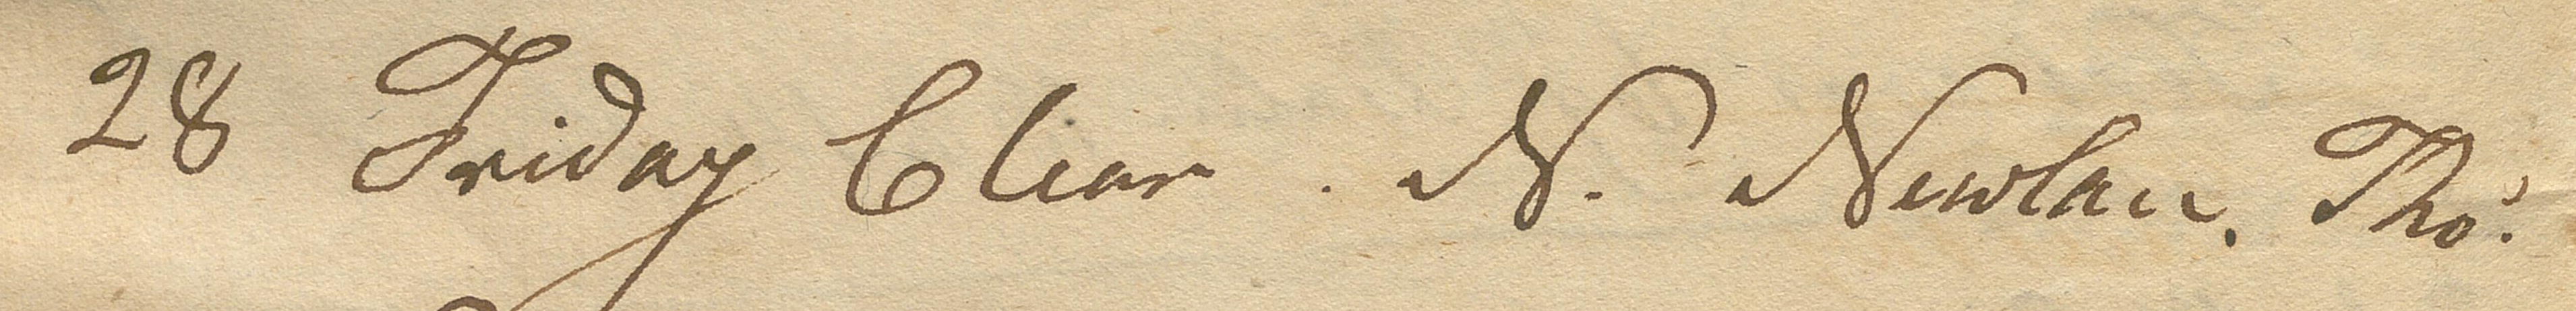28 Friday Clear. N. Newlan Tho^s.
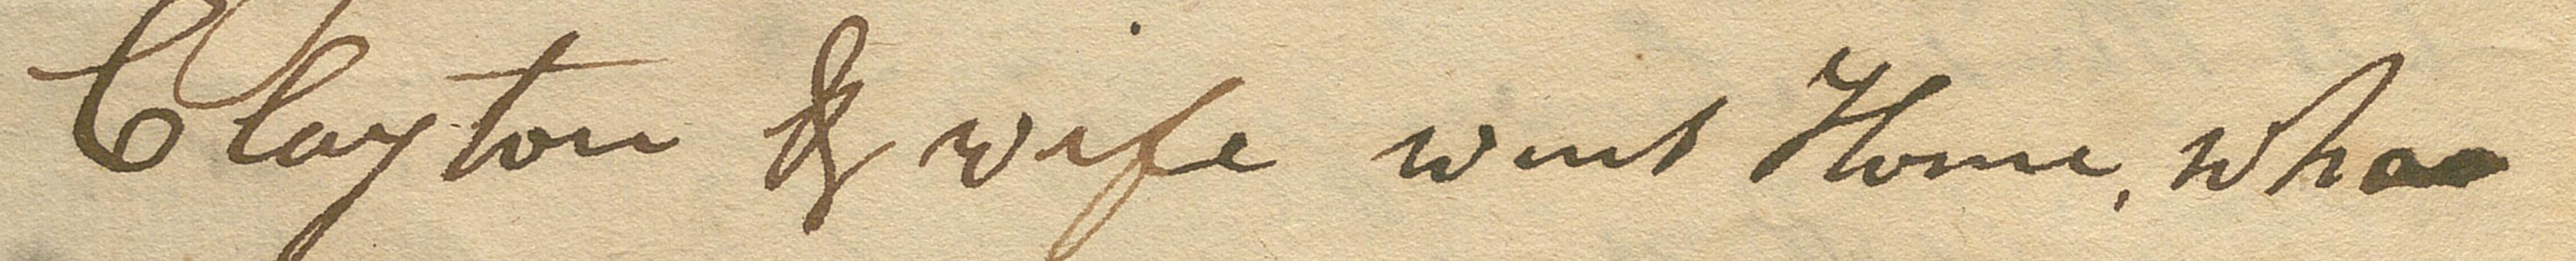Clayton & wife went Home, who
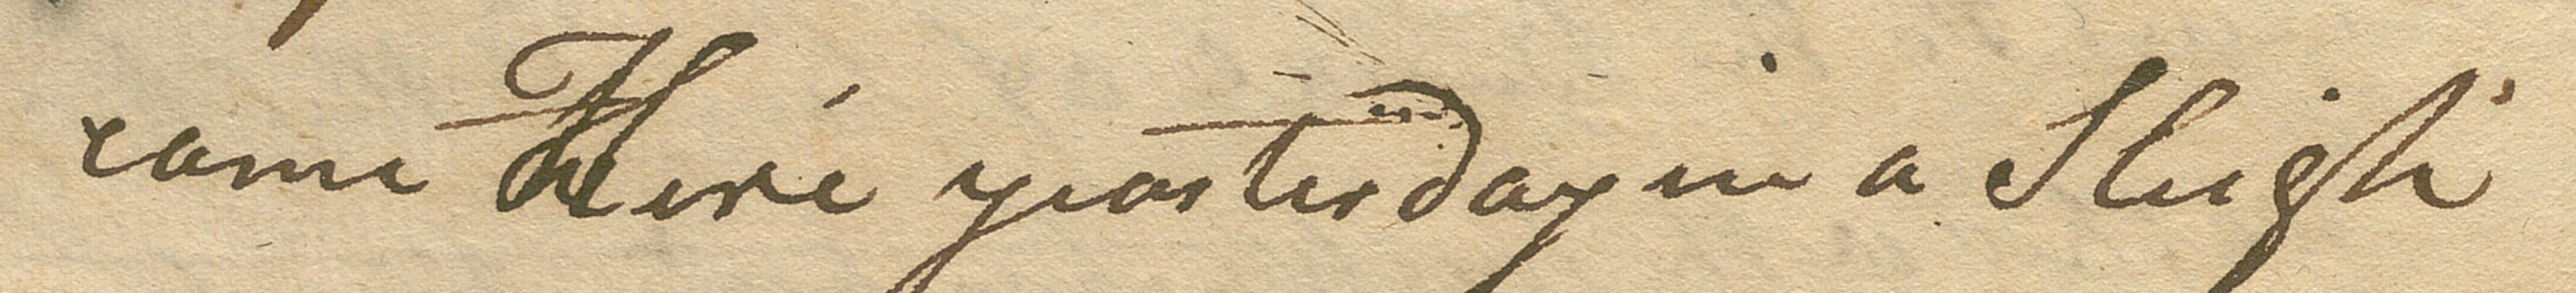came Here yeasterday in a Sleigh
